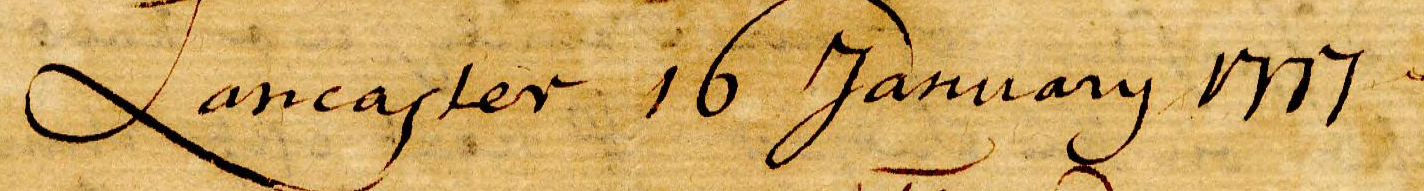Lancaster 16^th January 1777-
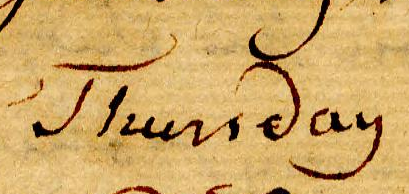Thursday
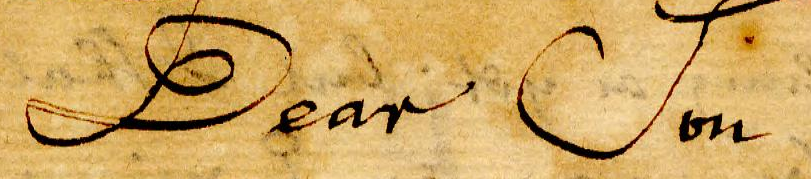Dear Son
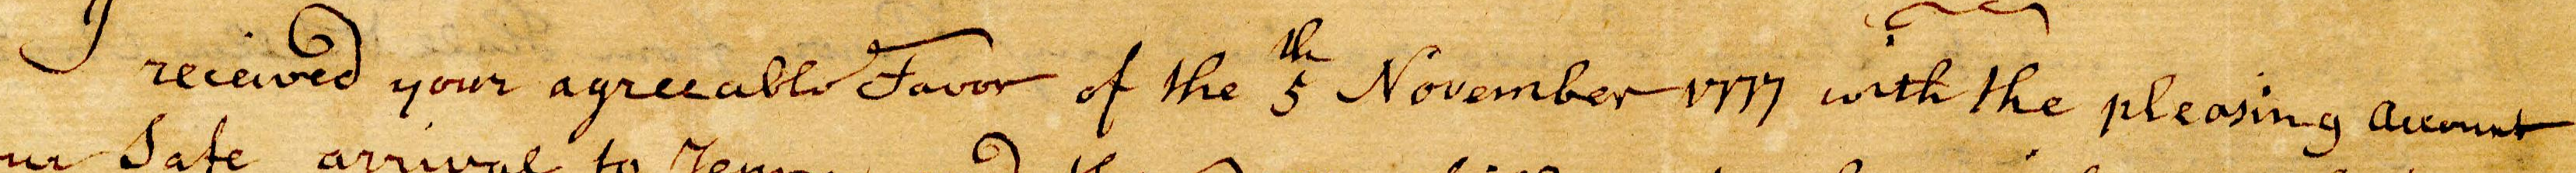I received your agreeable Favour of the 5^th November 1777 with the pleasing Account
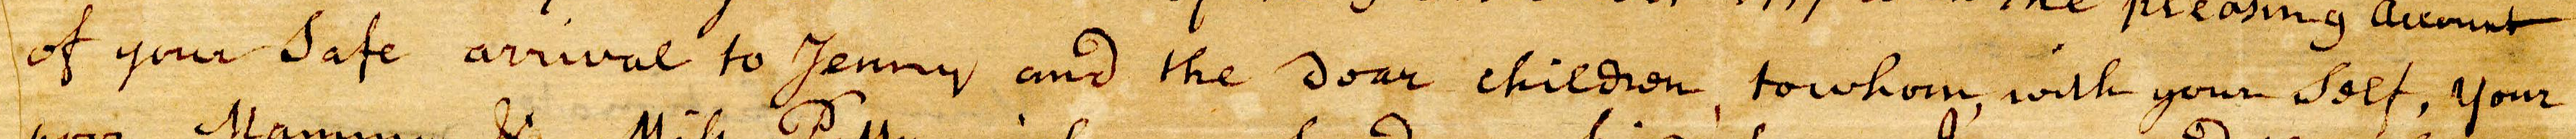of your Safe arrival to Jenny and the dear children, to whom, with your Self, You
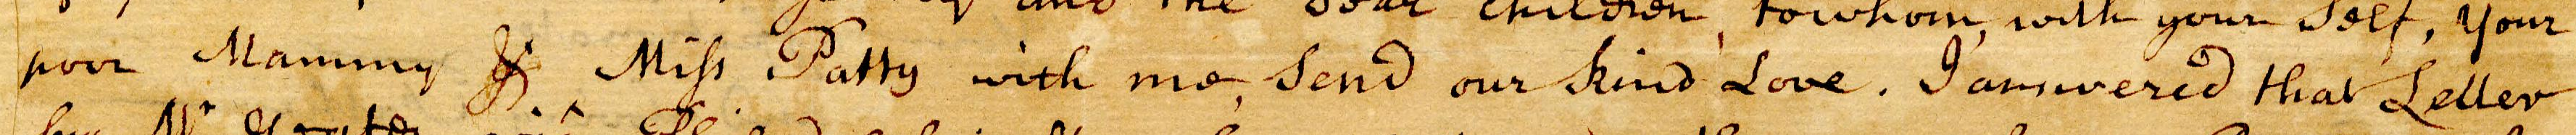poor Mammy & Miss Patty with me, Send our kind Love. I answered that Letter
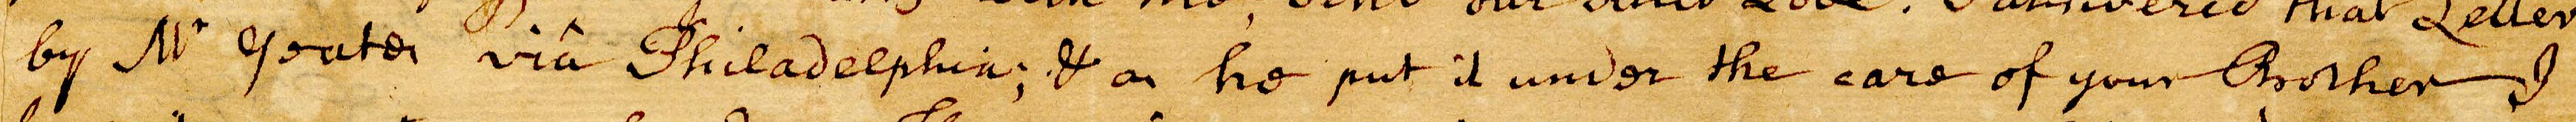by M^r Yeates via Philadelphia, & as he put it under the care of your Brother I
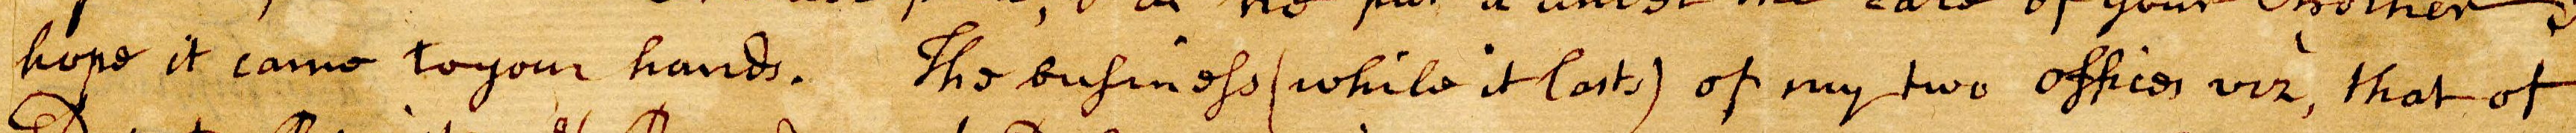hope it came to your hands. The business (while it lasts) of my two offices viz, that of
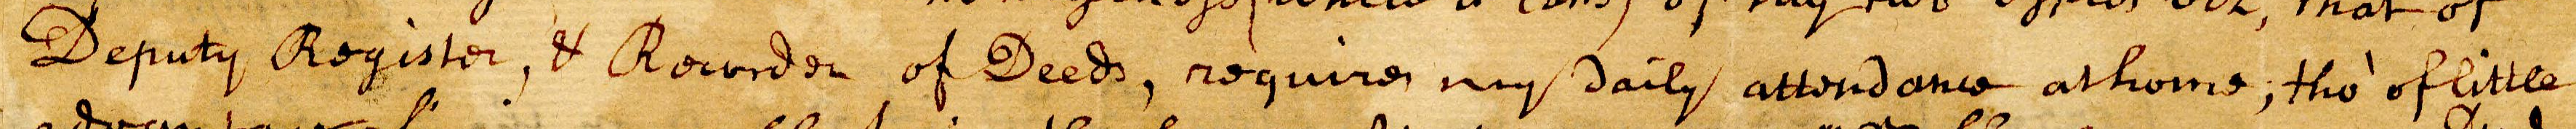Deputy Register, & Rounder of Deeds, require my daily attendance at home; tho' of little
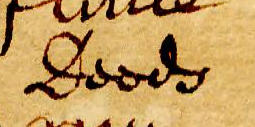Deeds
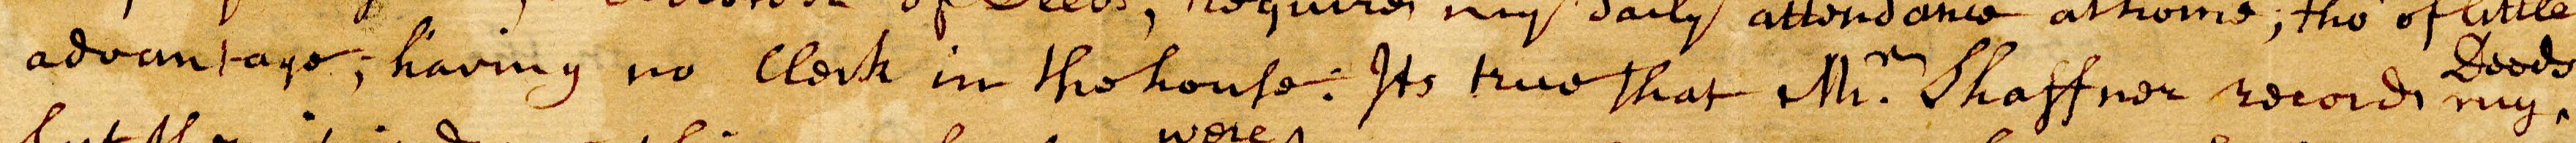advantage; having no Clerk in the house: Its true that M^r. Shaffner records my ^
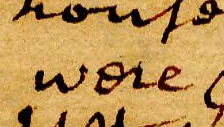were
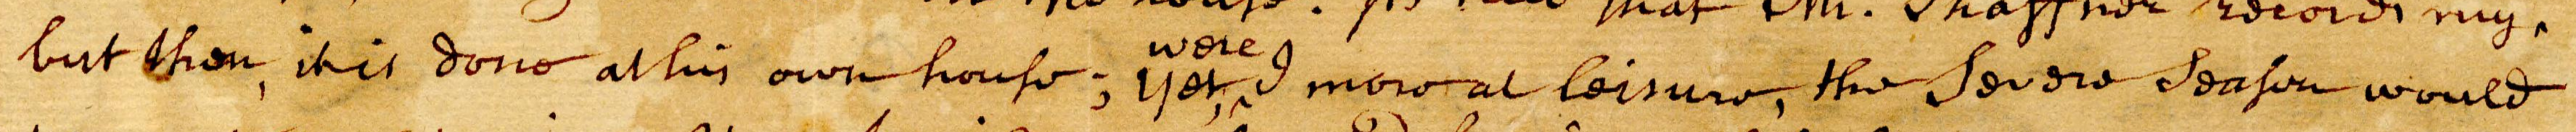but then, it is done at his own house; yet, ^ I move at leisure, the second Season would
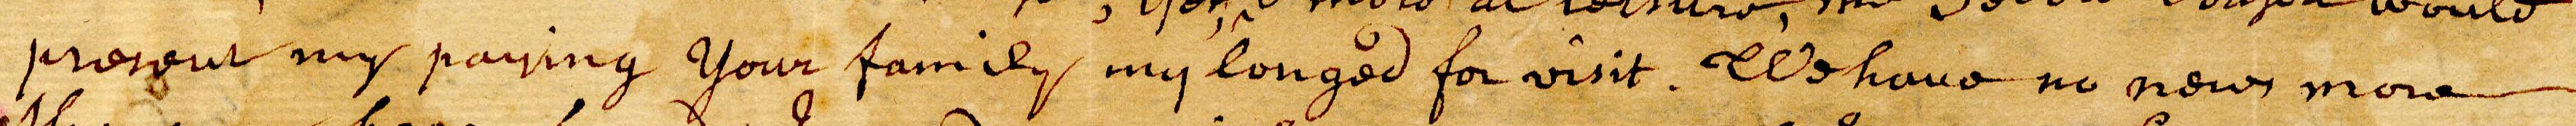present my paying Your family my longed for visit. We have no news more
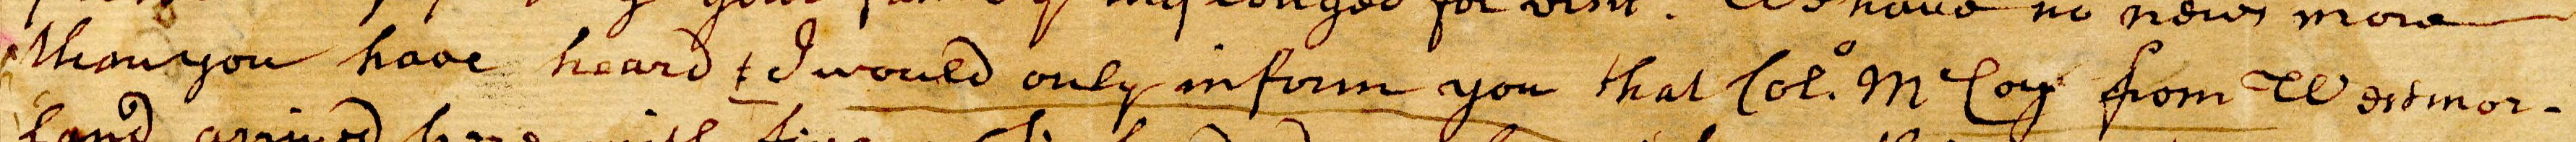than you have heard = I would only inform you that Col^o. M Coy from Westmor-
